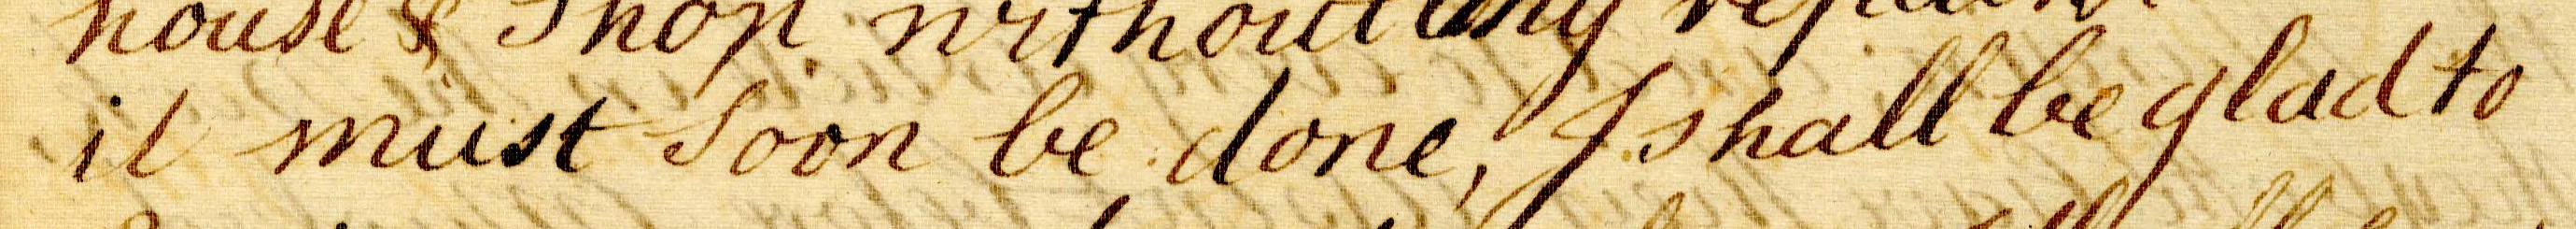it must soon be done, I shall be glad to
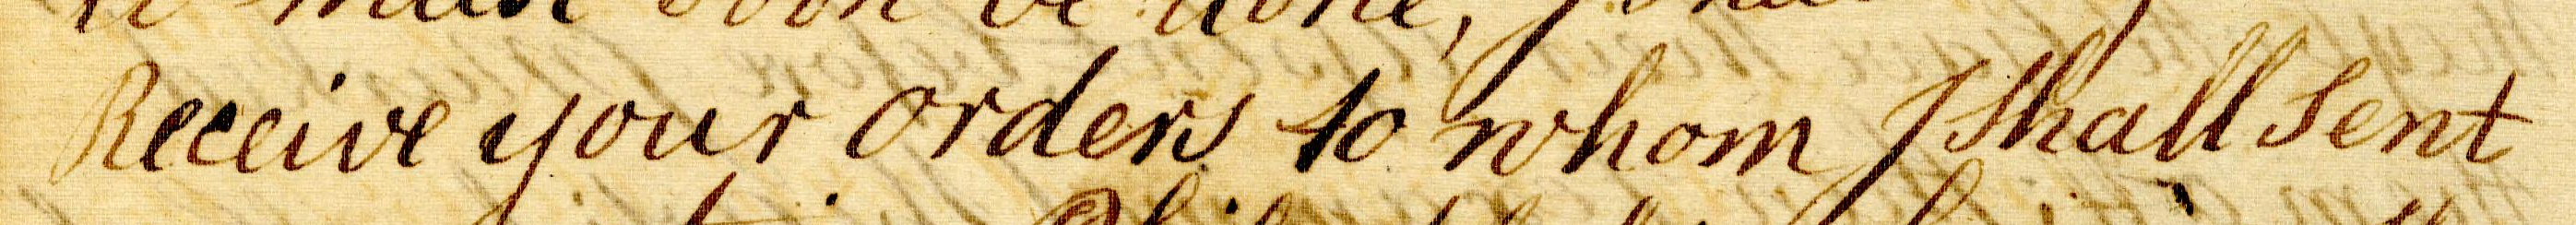Receive your orders to whom I shall sent
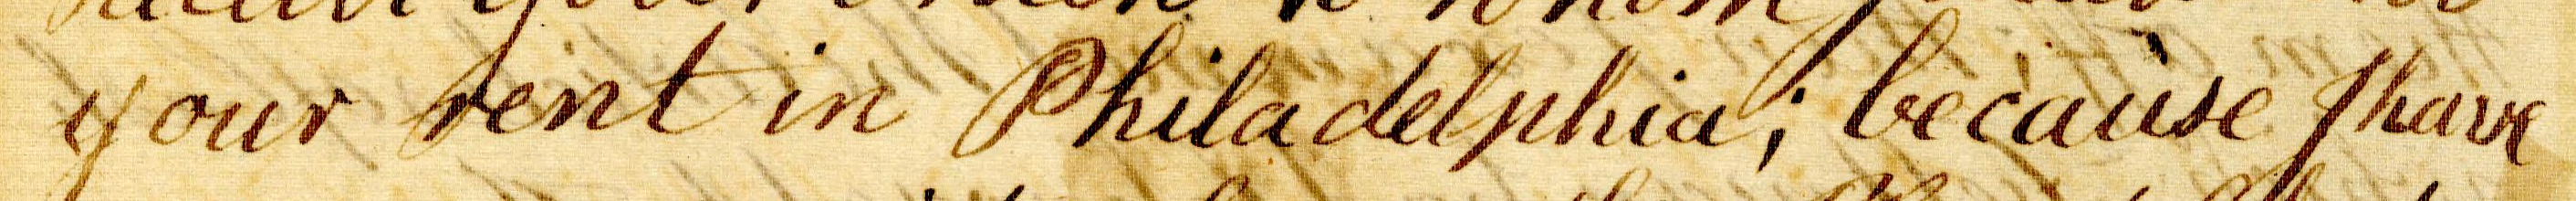your rent in Philadelphia; because I have
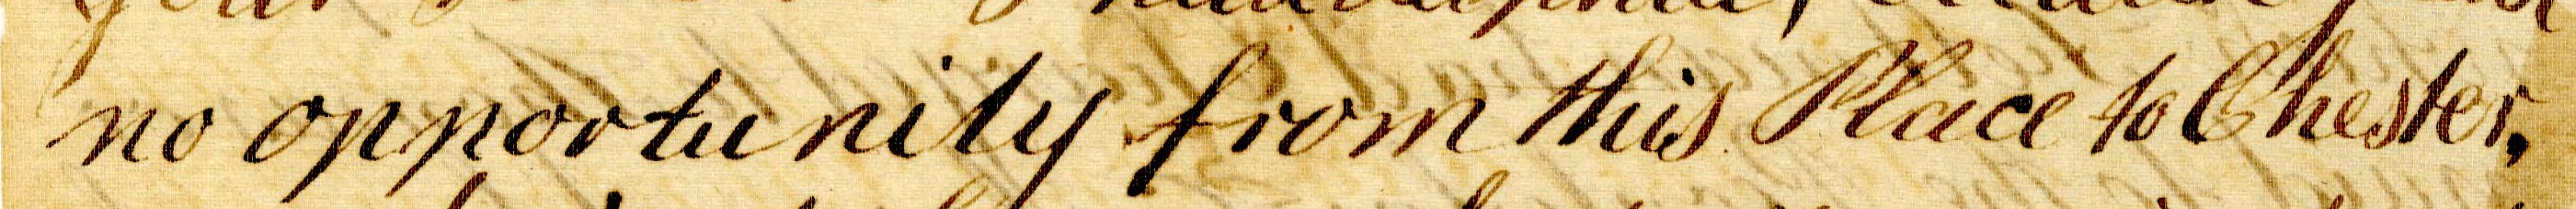no opportunity from this Place to Chester.
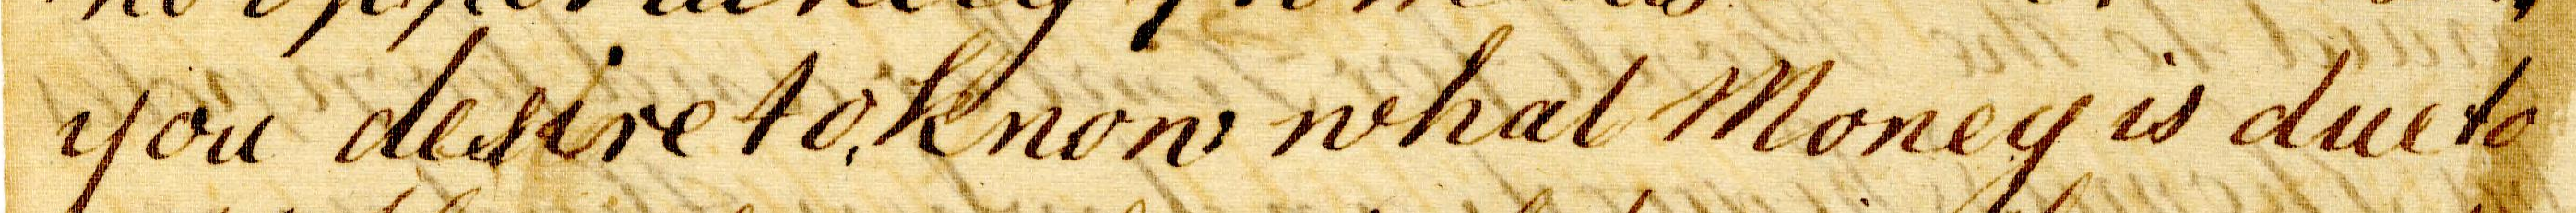You desire to, know what Money is due to
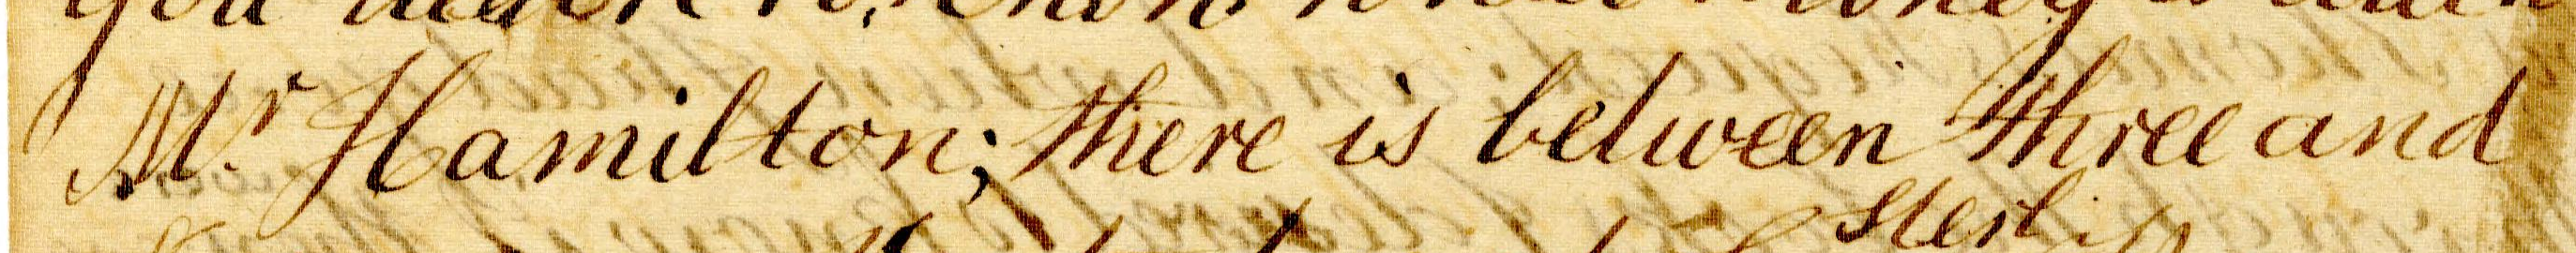M^r. Hamilton; there is between three and
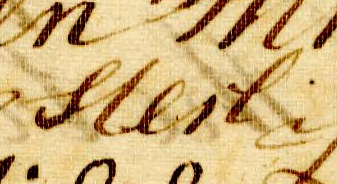Sterl
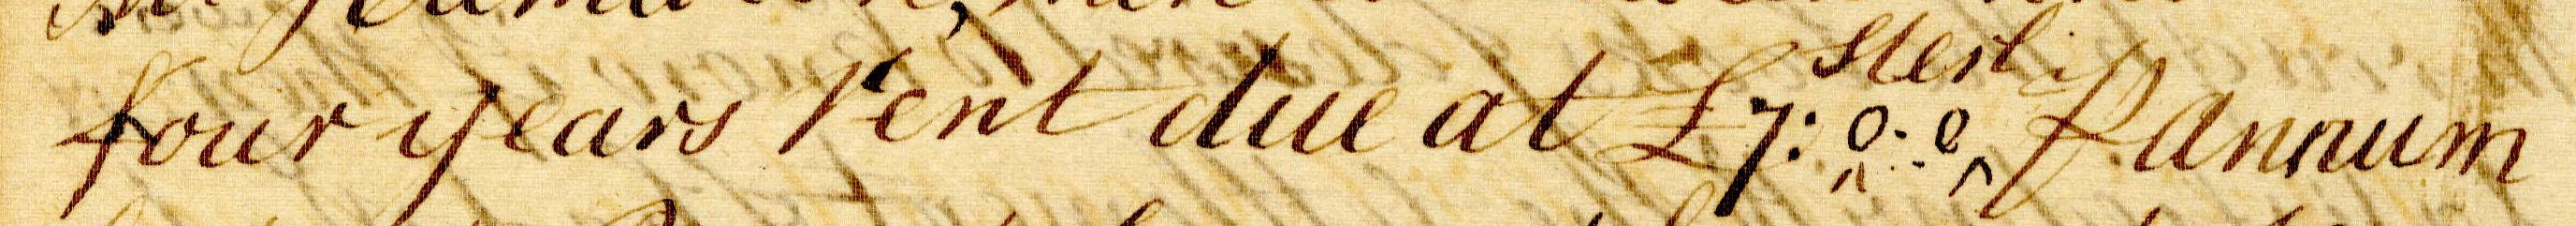four years rent due at £7:0:0 Per Annum
